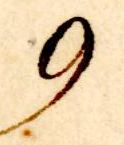9
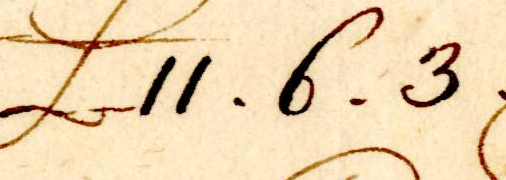£11.6.3
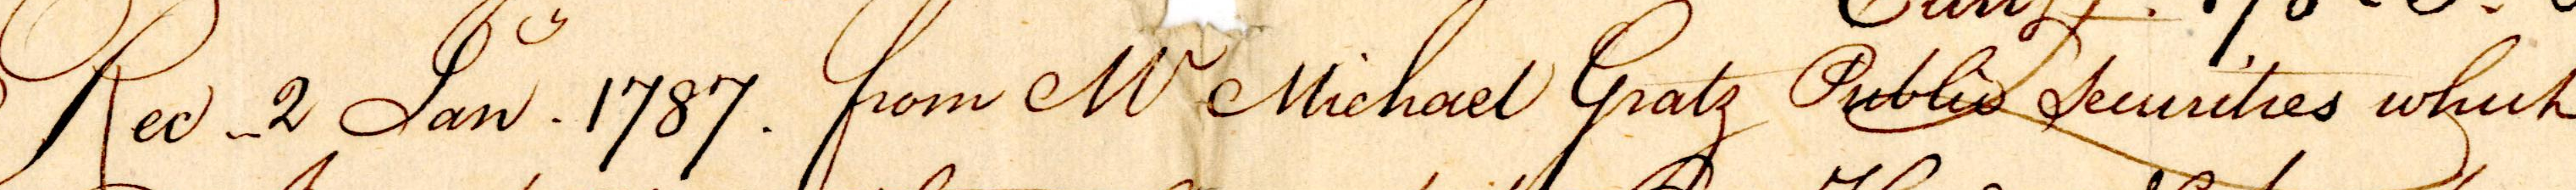Rec 2 Jan^y. 1787. from M^r Michael Gratz Public Securities which
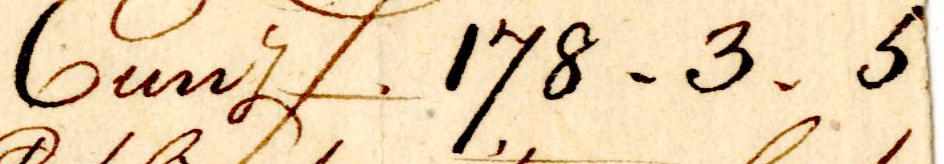Curr^y £178.3.5
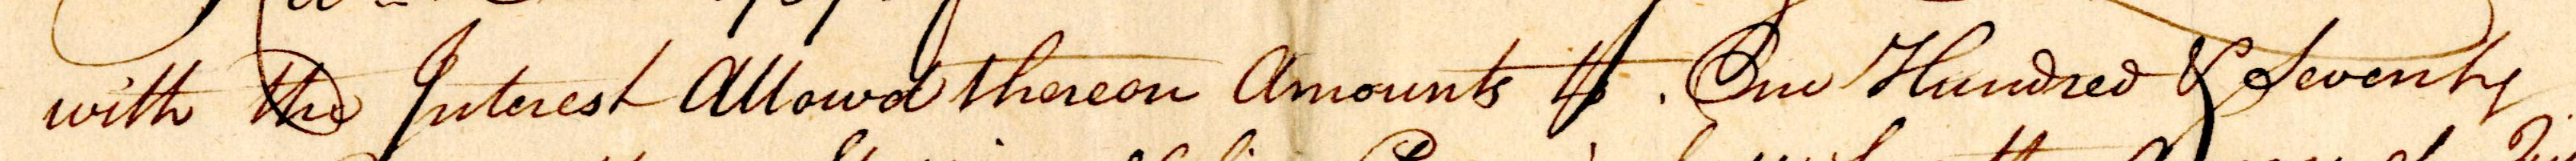with the Interest Allowed thereon Amounts to One Hundred & Seventy
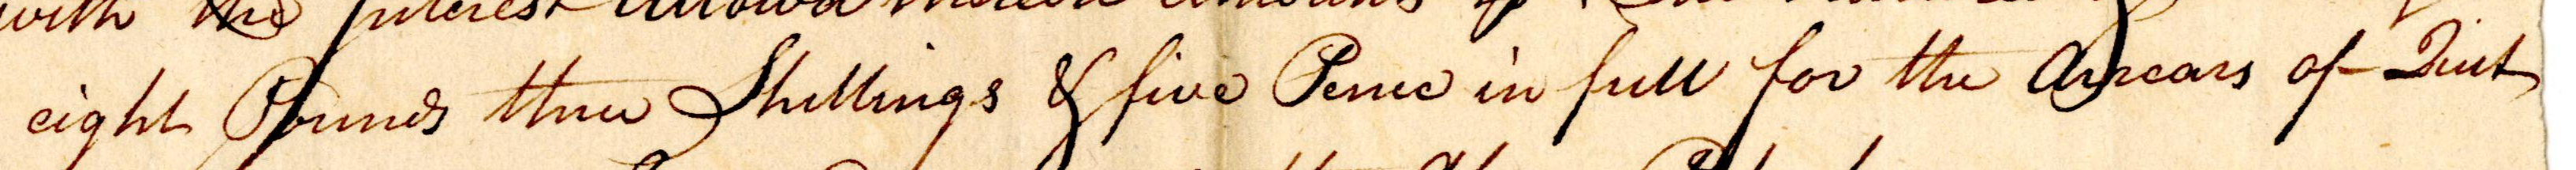eight Pounds three Shillings & five Pence in full for the Arrears of Quit
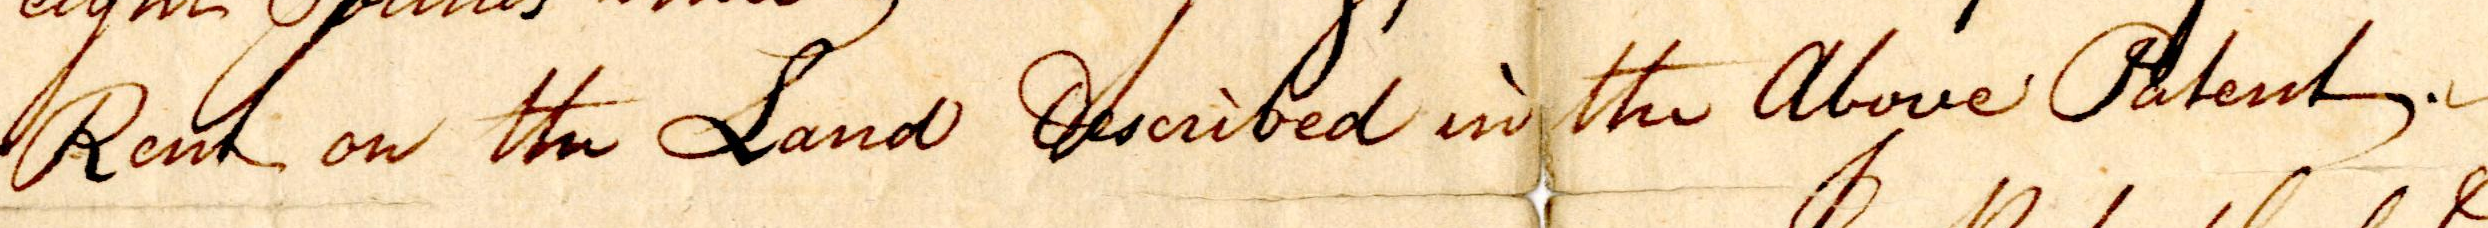Rent on the Land Described in the Above Patent.
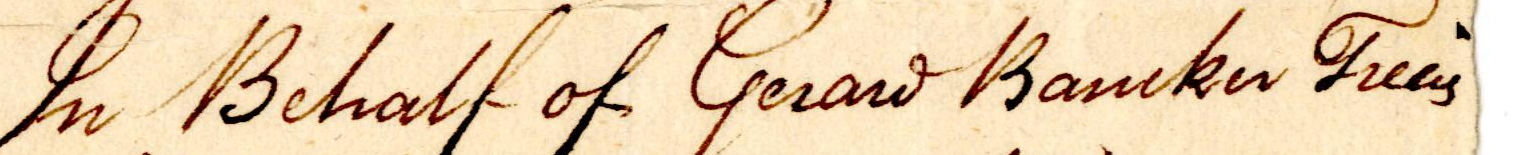In Behalf of Gerard Bancker Treas
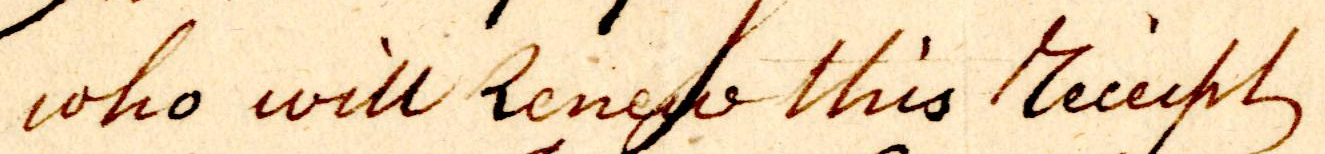who will reneice this receipt
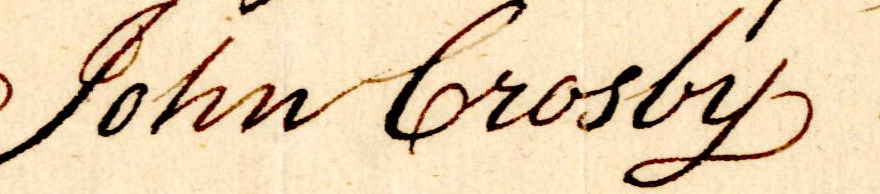John Crosby
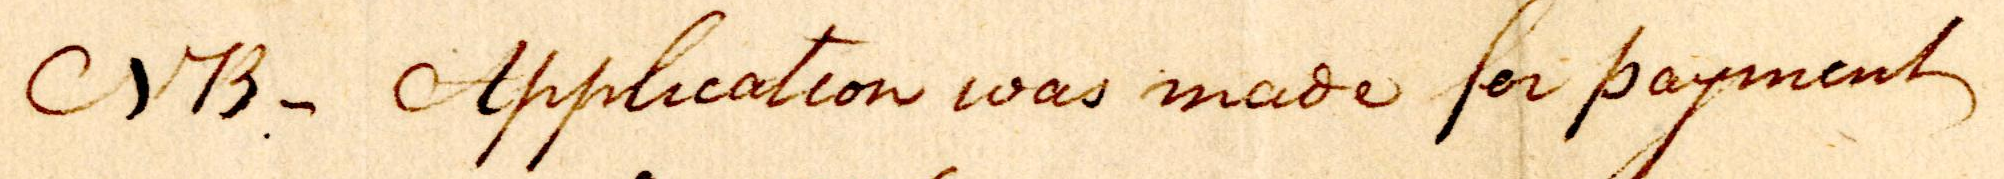NB- Application was made for payment
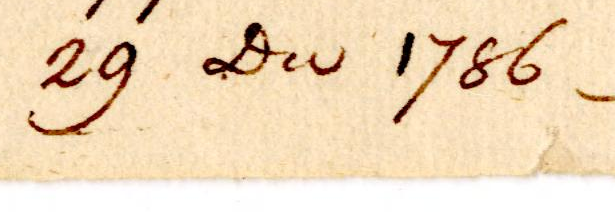29 Dec 1786.
